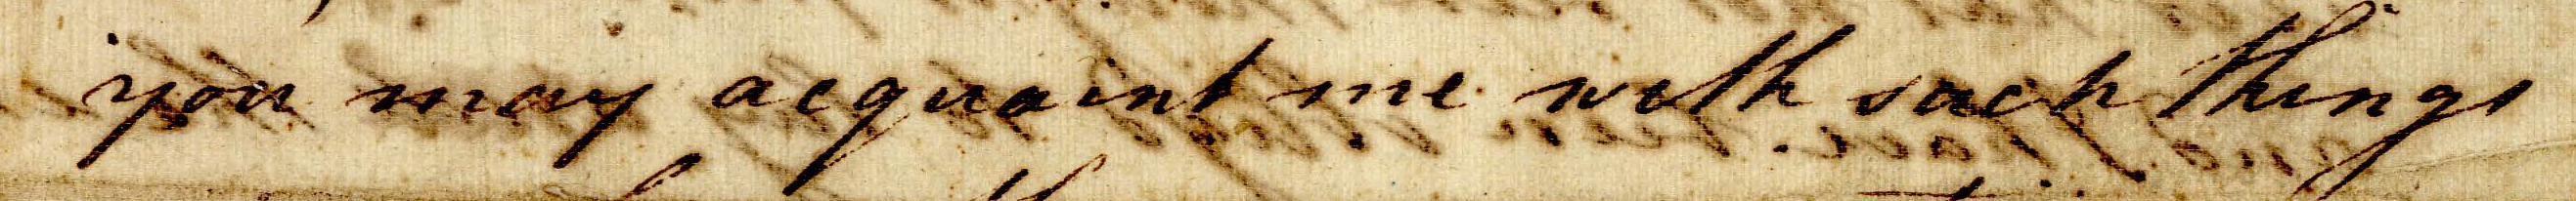you may acquaint me with such things
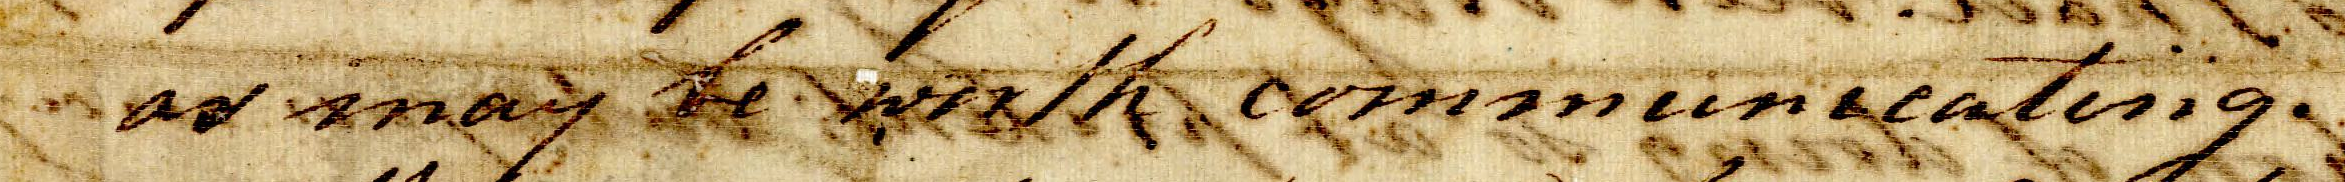as may be worth communicating.
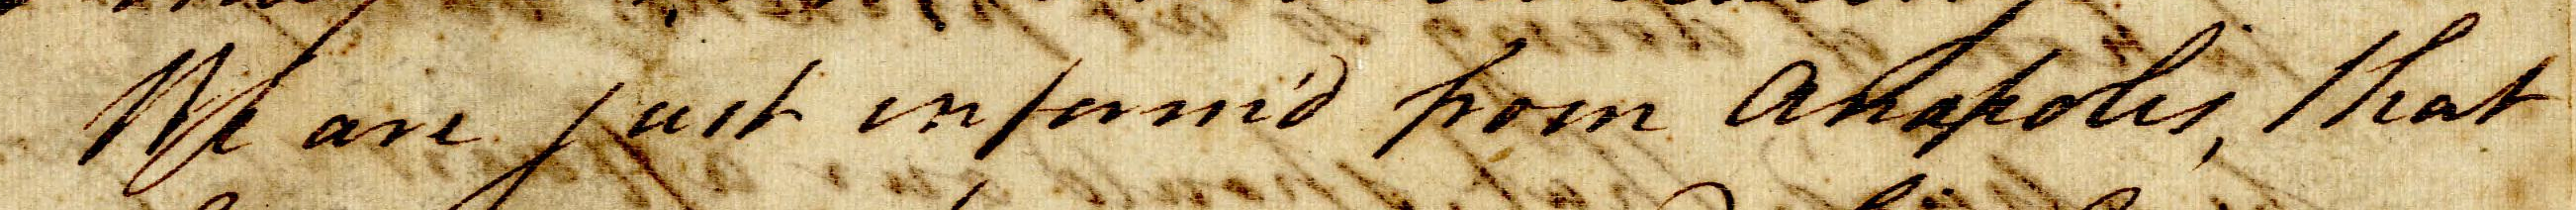We are just inform'd from Anapolis, that
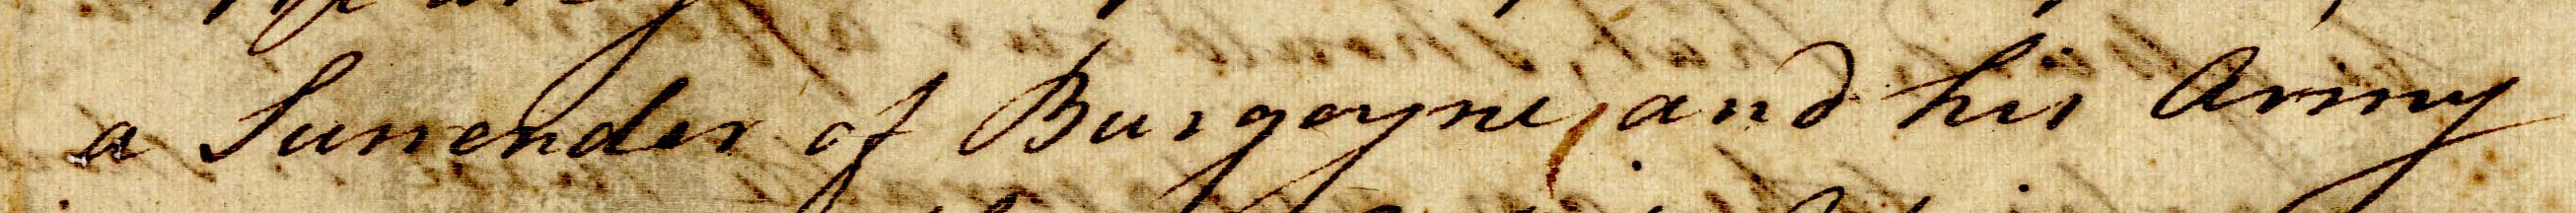a Surrender of Burgoyne and his Army
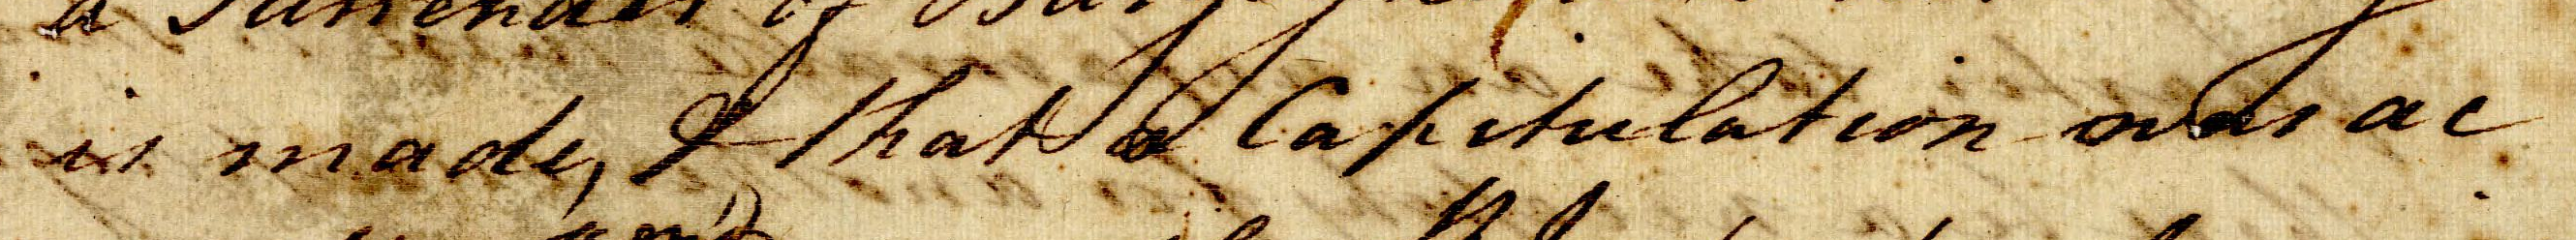is made, & that a Capitulation was ac
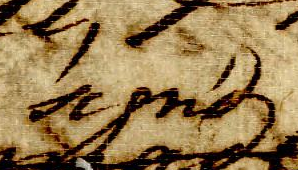sign'd
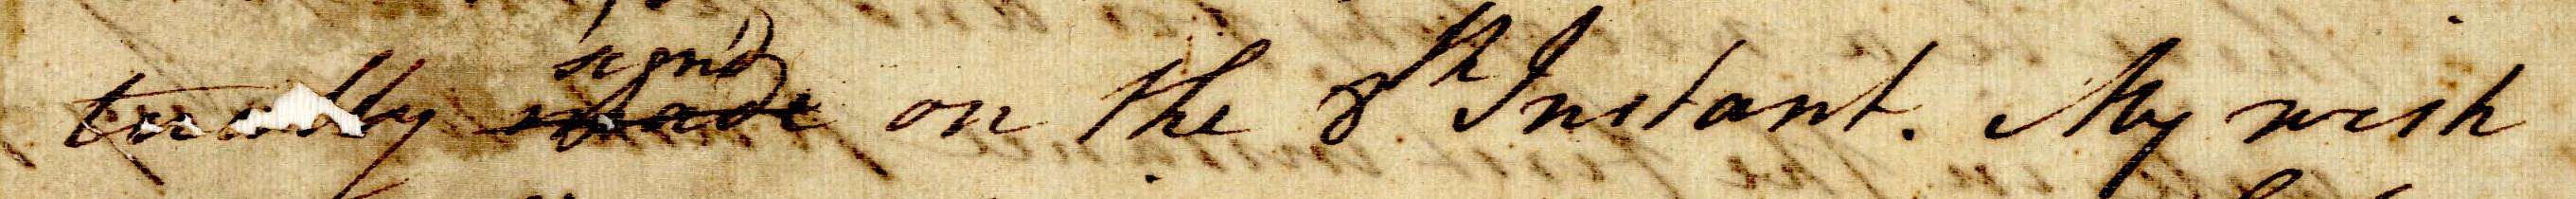tually [made] on the 8^th Instant. My wish
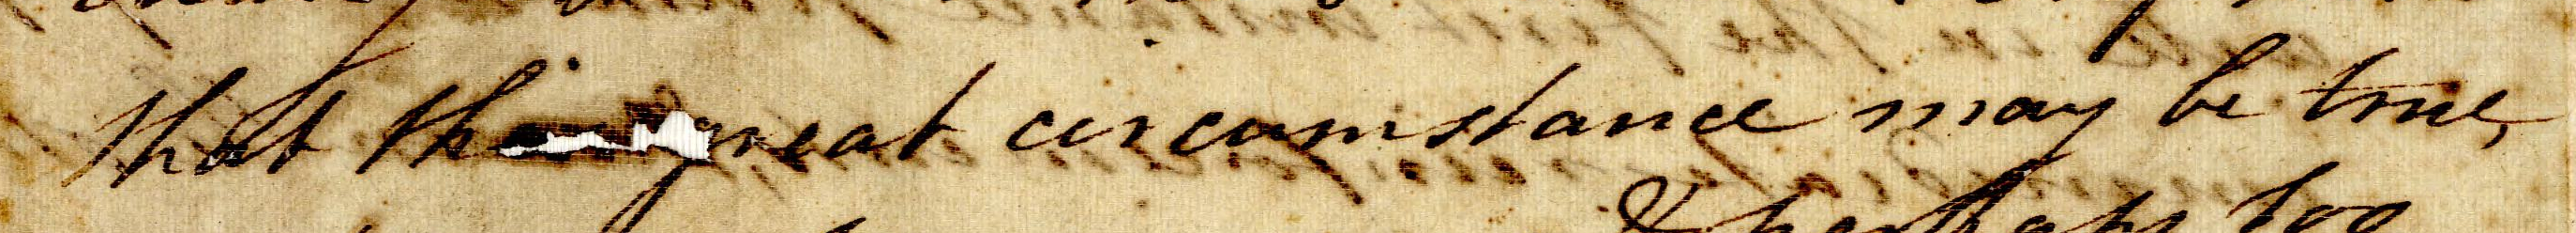that this great circumstance may be true,
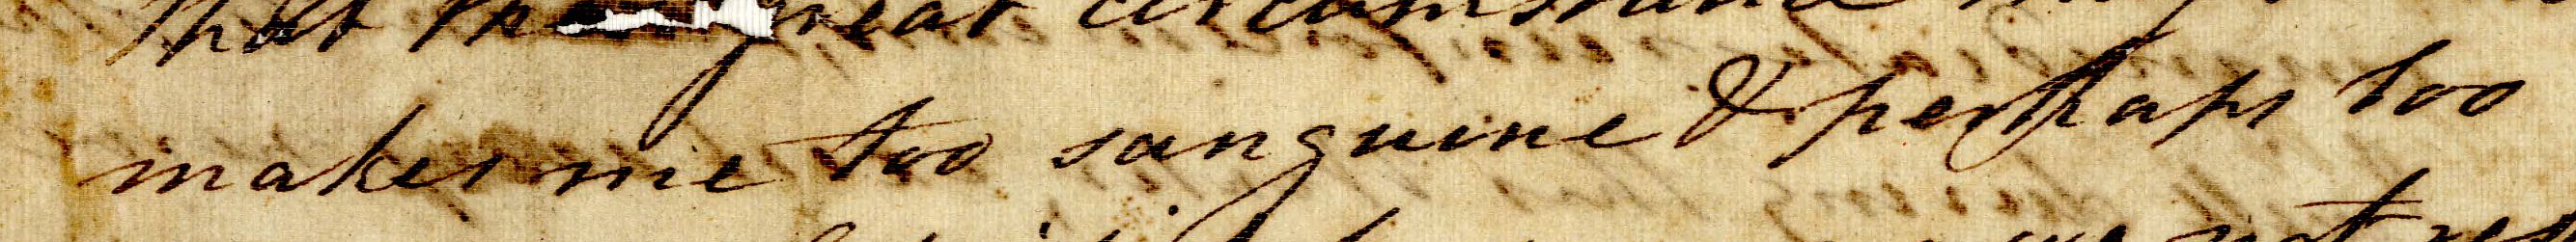makes me too sanguine & perhaps too
